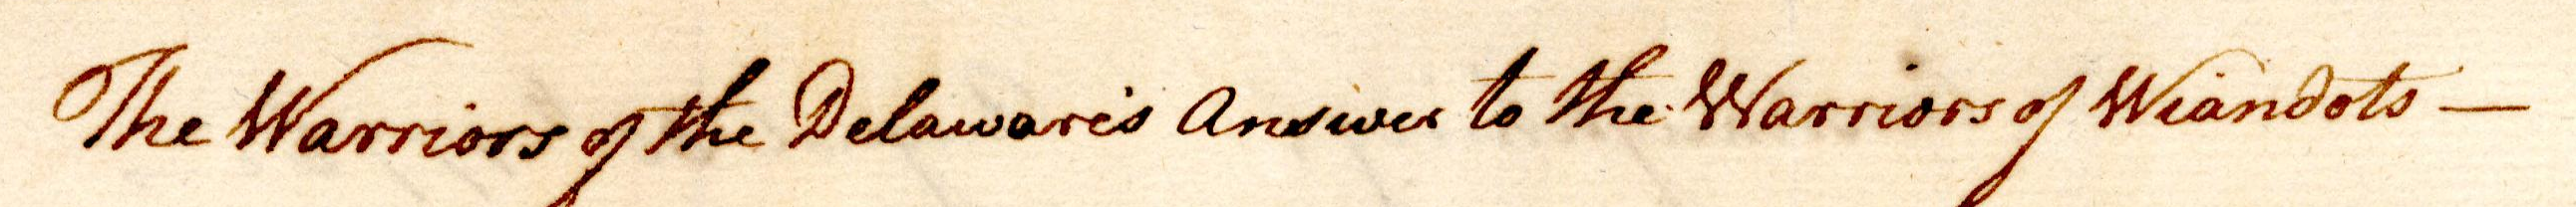The Warriors of the Delaware's Answer to the Warriors of Wiandots-
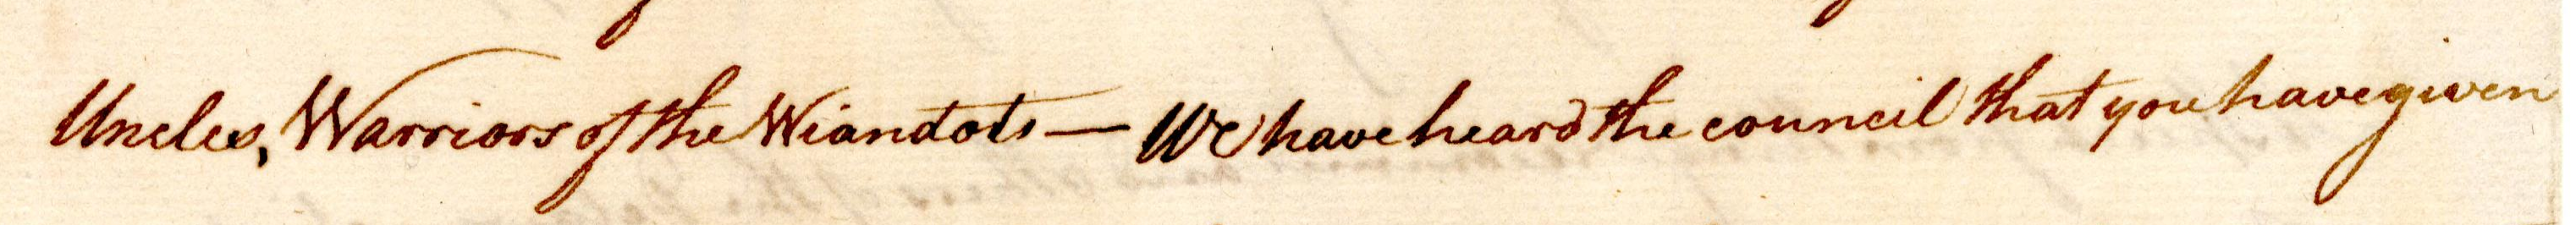Uncles, Warriors of the Wiandots- We have heard the council that you have given
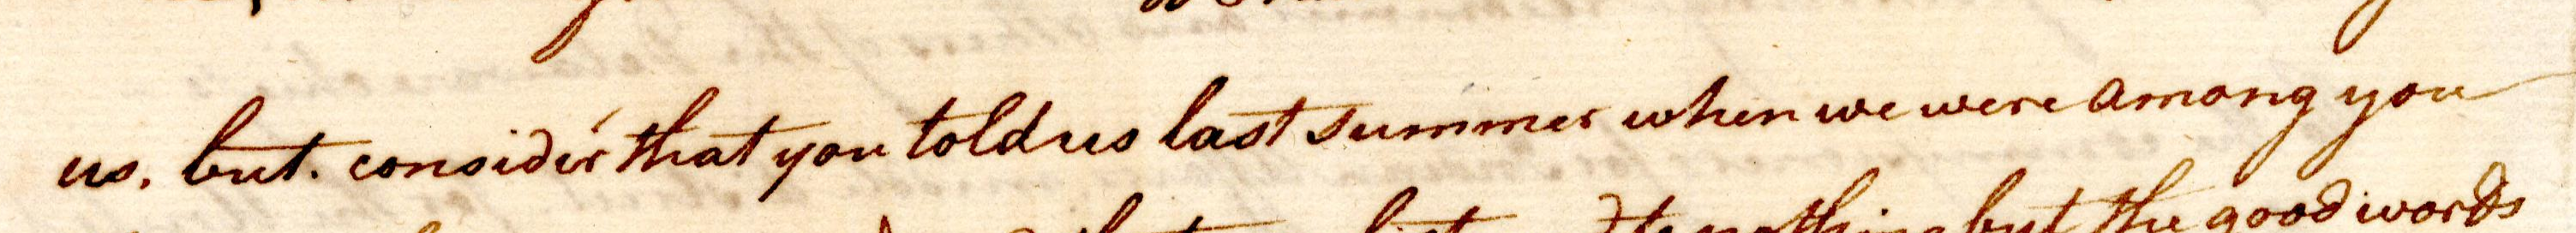us, but consider that you told us last summer when we were among you
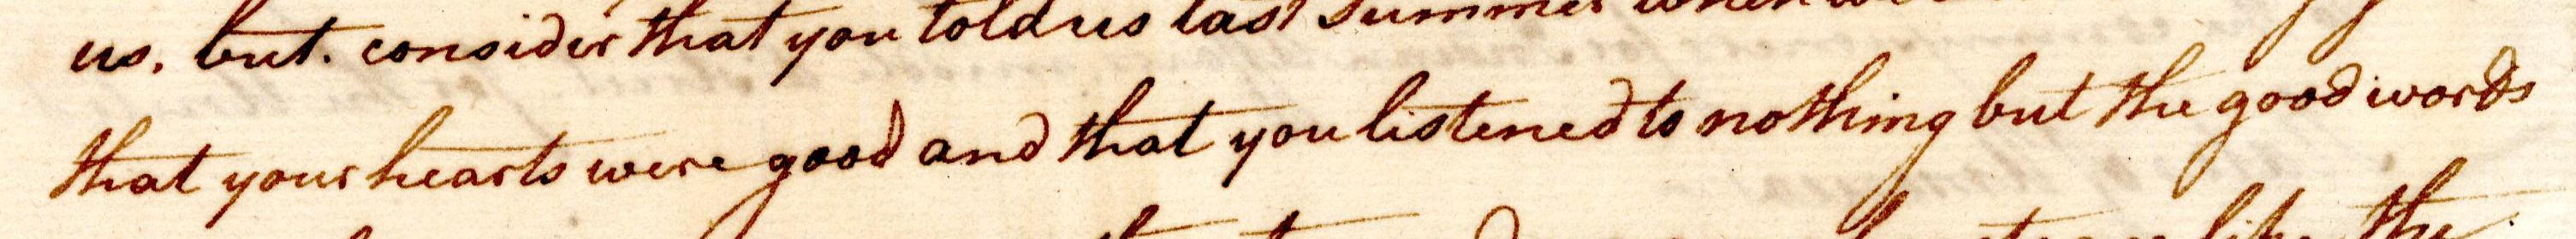that your hearts were good and that you listened to nothing but the good words
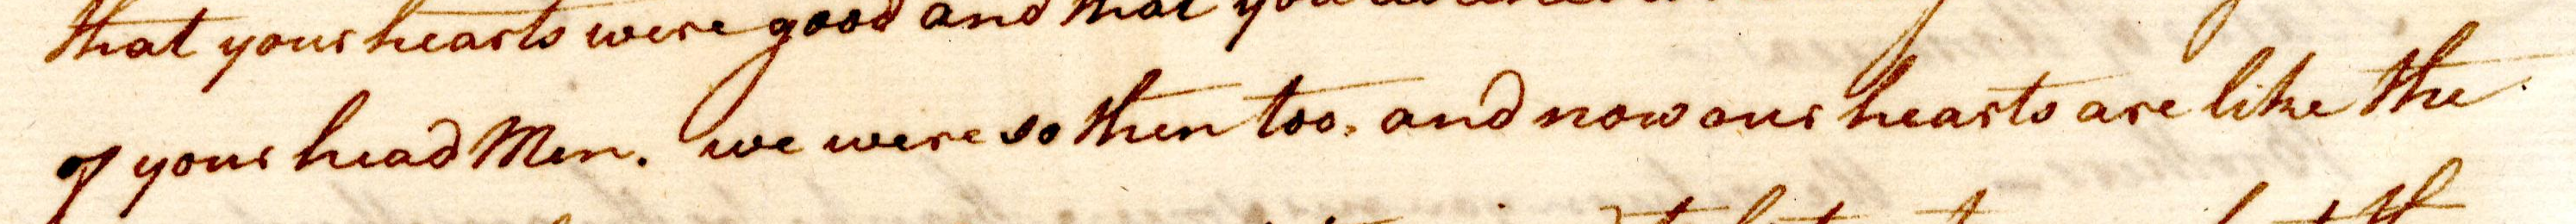of your head Men. we were so then too, and now our hearts are like the
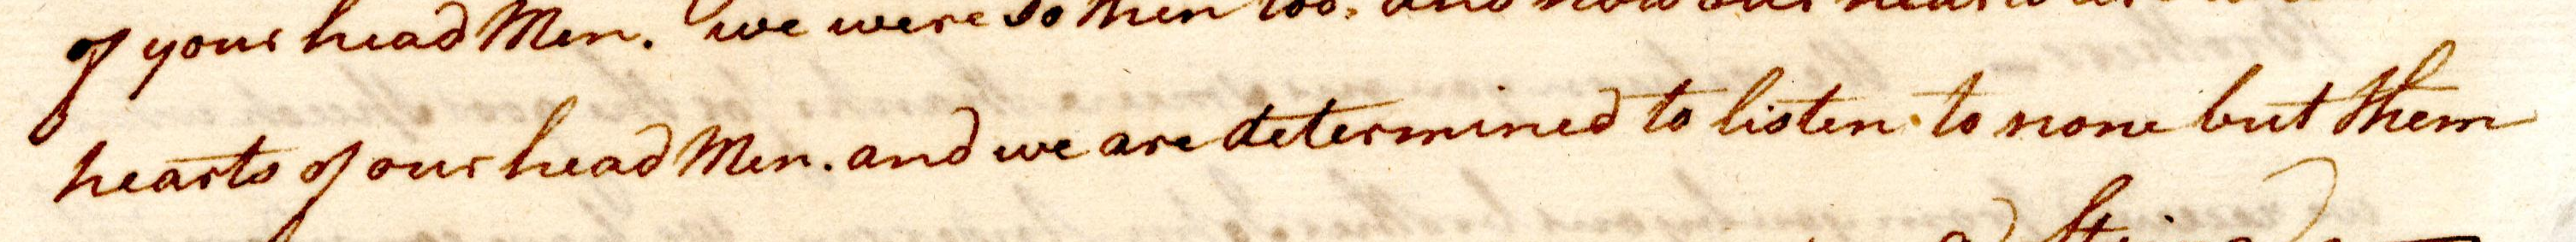hearts of our head Men, and we are determined to listen to none but them
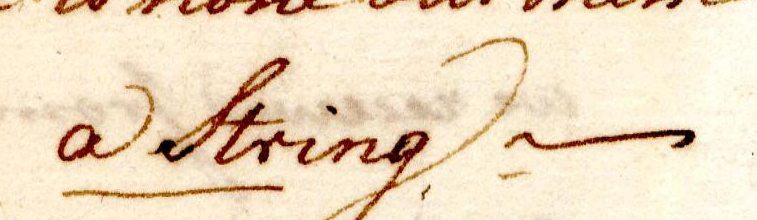a String-
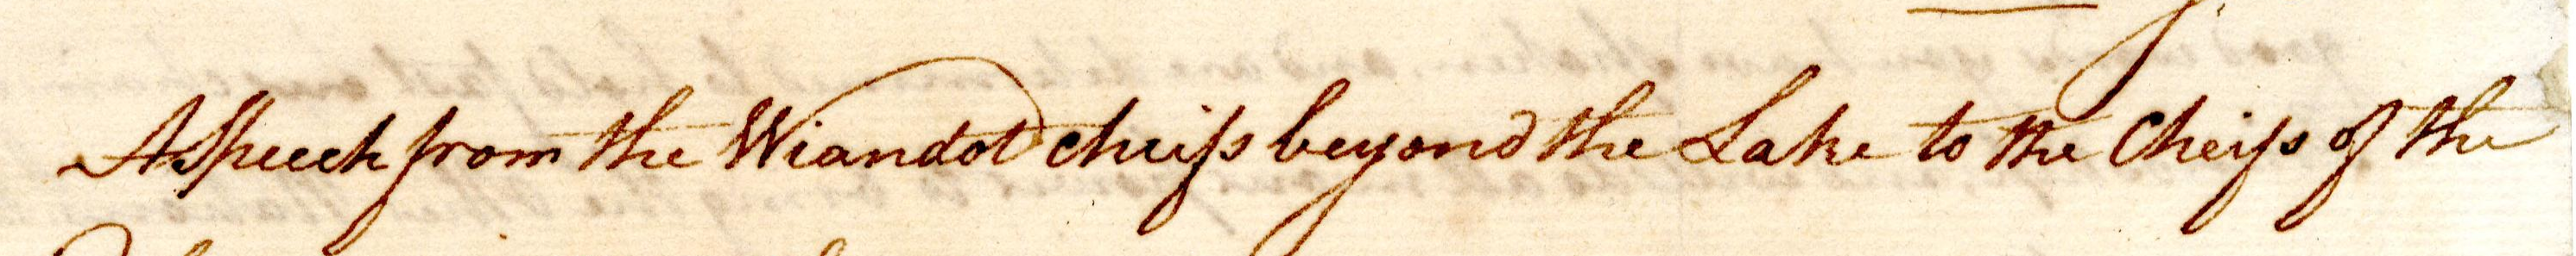A Speech from the Wiandot cheifs beyond the Lake to the Cheifs of the
